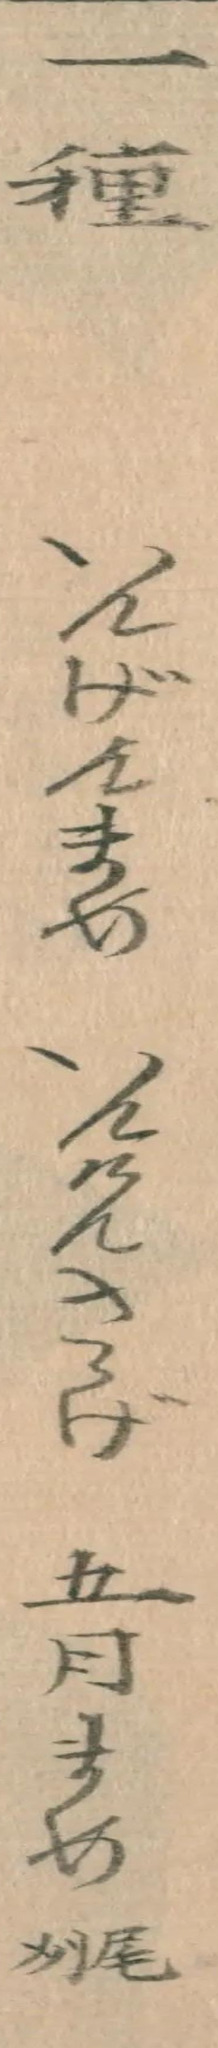一種いんげんまめいんけんさゝげ五月まめ尾州
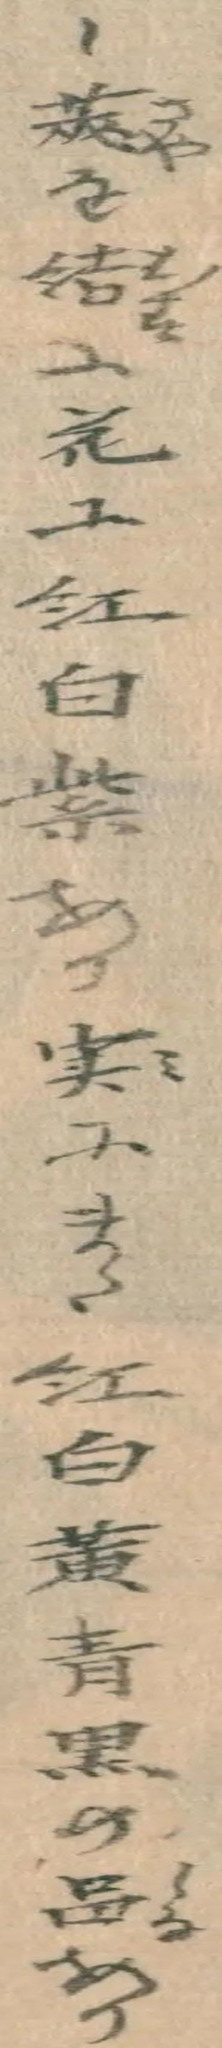し莢を結ふ花に紅白紫あり実にまた紅白黄青黒の品あり
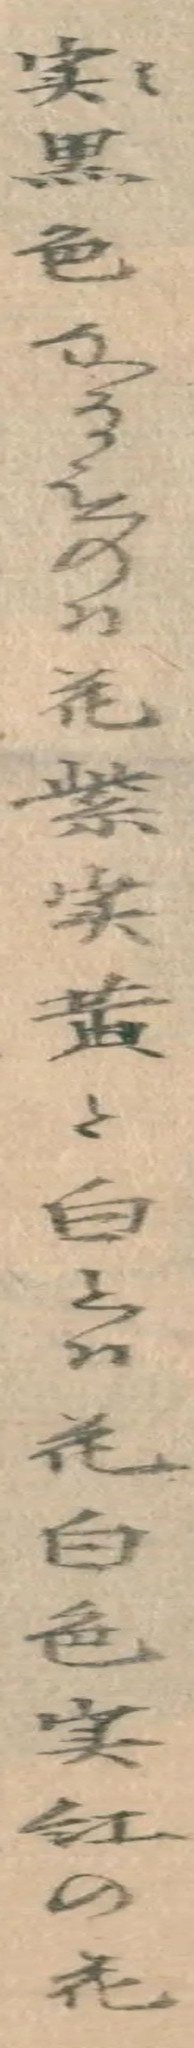実黒色なるものは花紫実黄と白とは花白色実紅の花
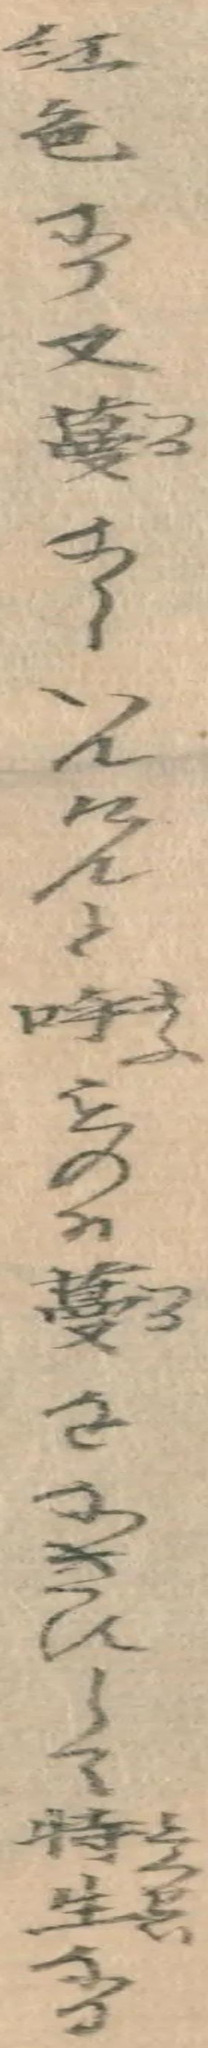紅色なり又蔓なしいんけんと呼ものは蔓をなさすして特生なる
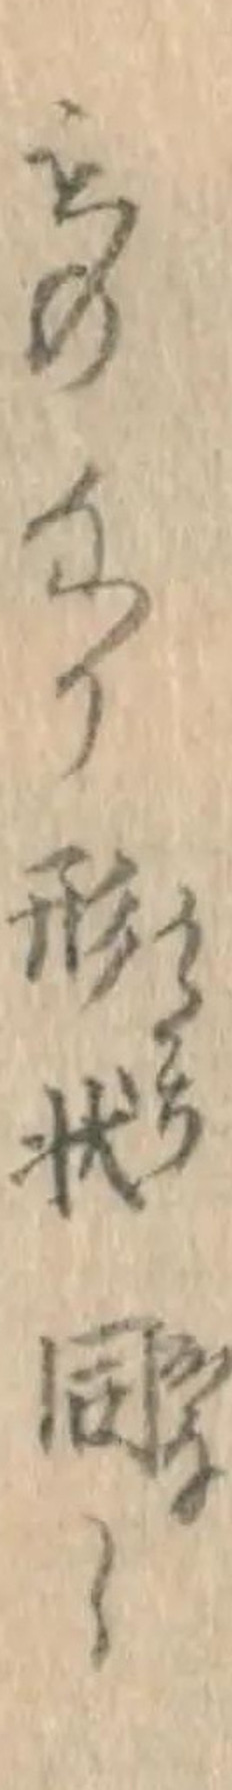ものなり形状同し

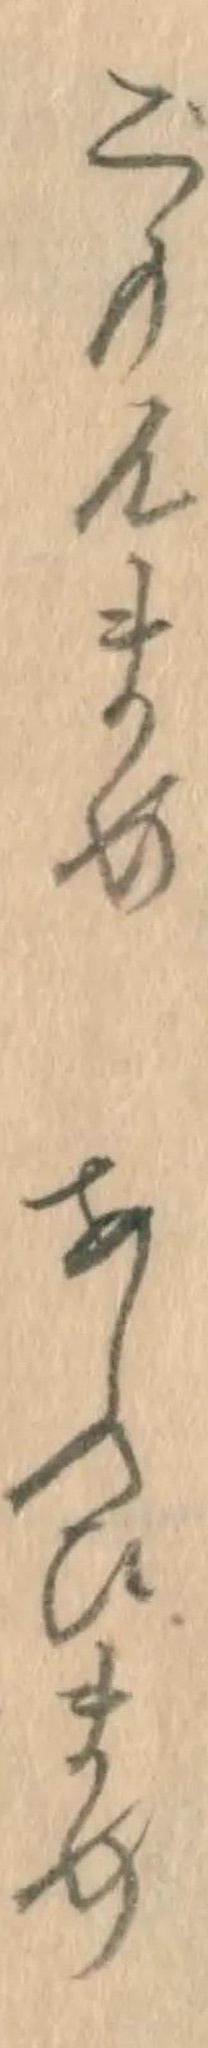ごもんまめあふひまめ
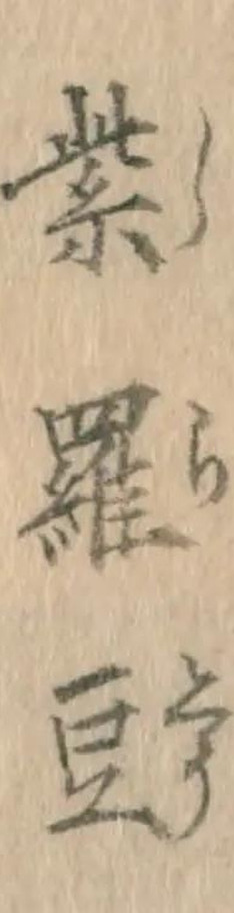紫羅豆

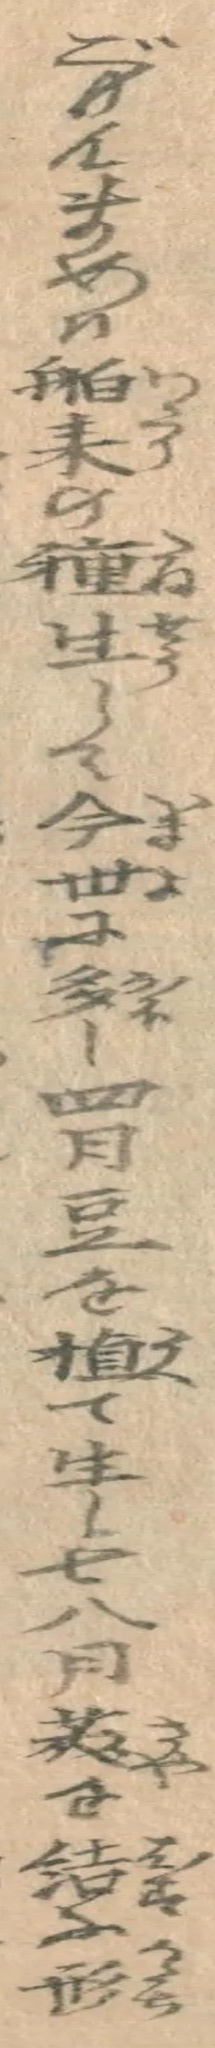ごもんまめは舶来の種生して今世に多し四月豆を植て生し七八月莢を結ふ形
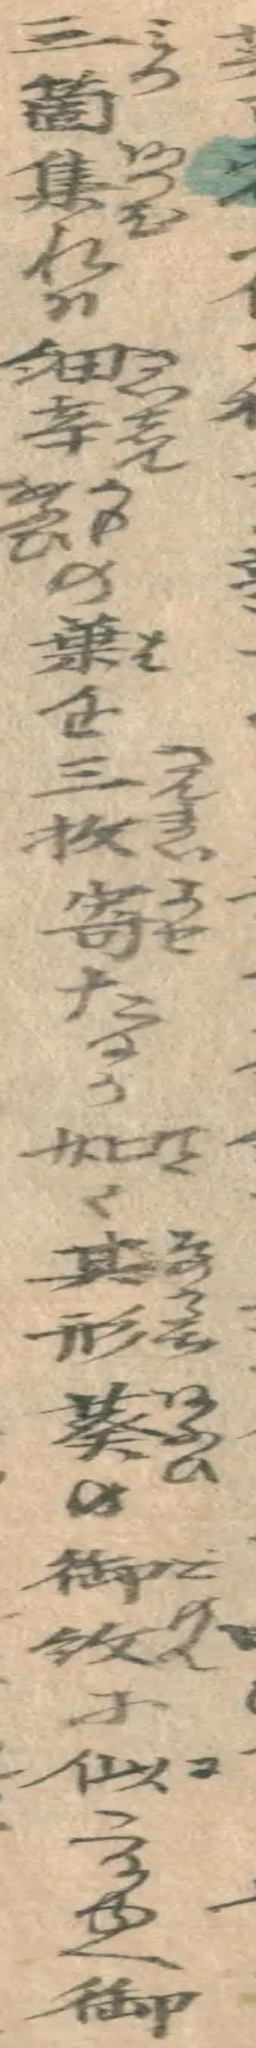三箇集れは細辛かもあふひの葉を三枚寄たるか如く其形葵の御紋に似たるゆへ御
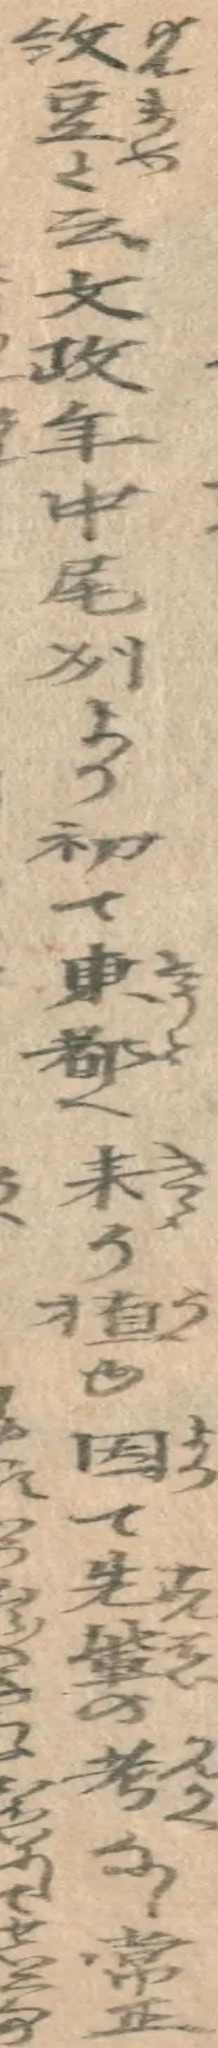紋豆と云文政年中尾州より初て東都へ来り植ゆ因て先輩の考なし常正
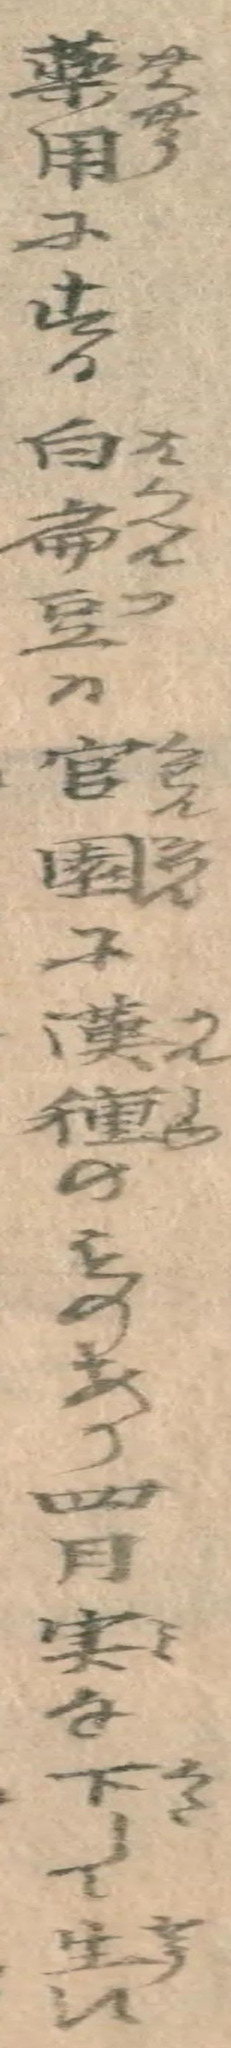薬用にする白扁豆は官園に漢種のものあり四月実を下して生す
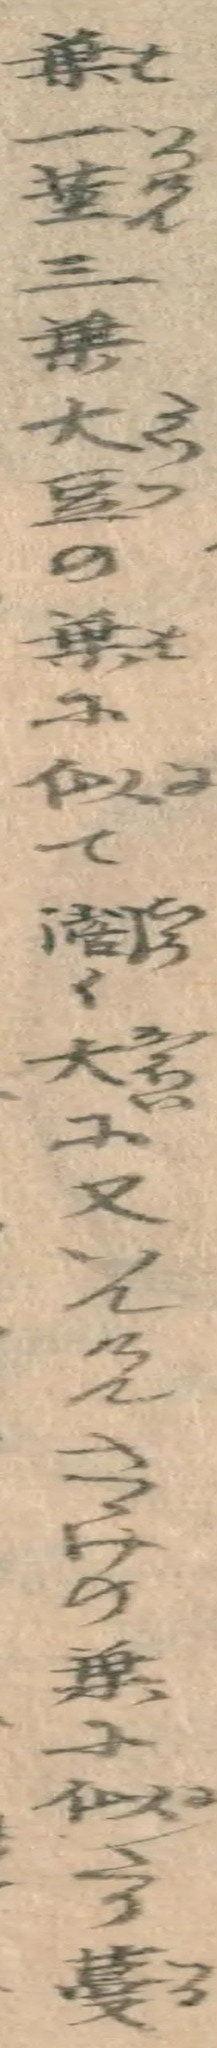葉一茎三葉大豆の葉に似て闊く大に又いんけんさゝけの葉に似たり蔓
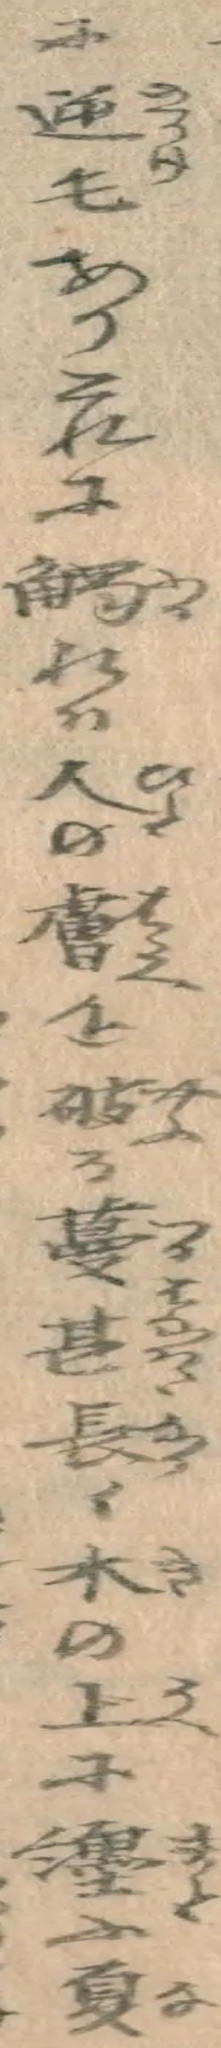に逆毛ありこれに触れは人の膚を破る蔓甚長く木の上に纏ふ夏
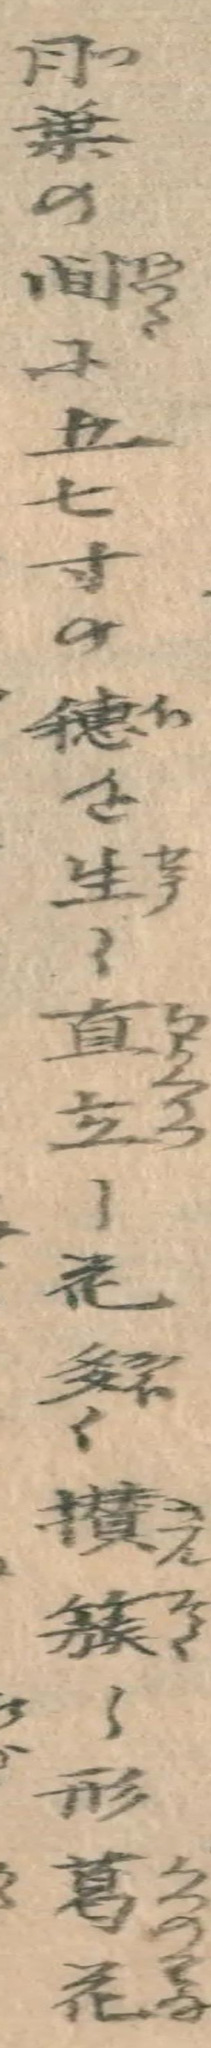月葉の間に五七寸の穂を生し直立し花多く攢簇し形葛花
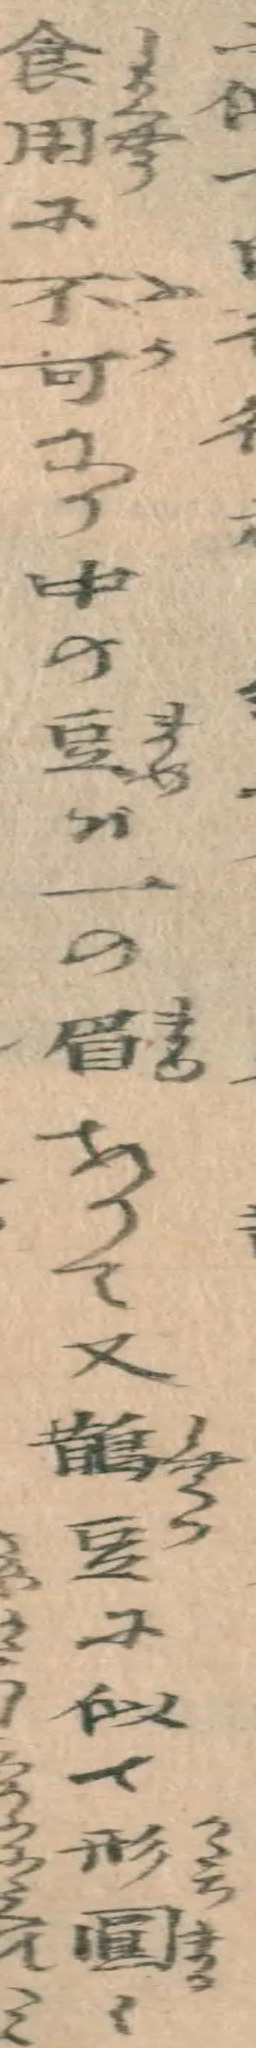食用に不可なり中の豆は一の眉ありて又鵲豆に似て形円く

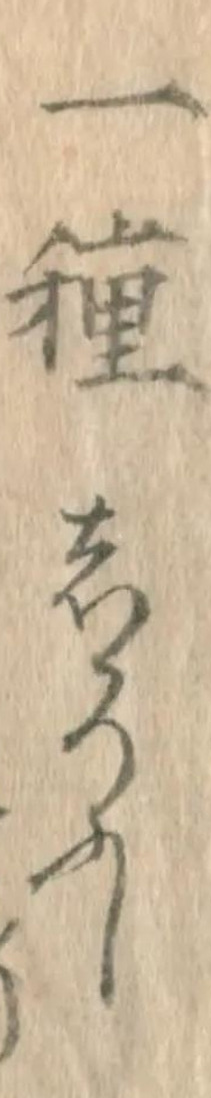一種しろふし
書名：本草図譜. 巻43-45
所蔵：国立国会図書館 National Diet Library, JAPAN
